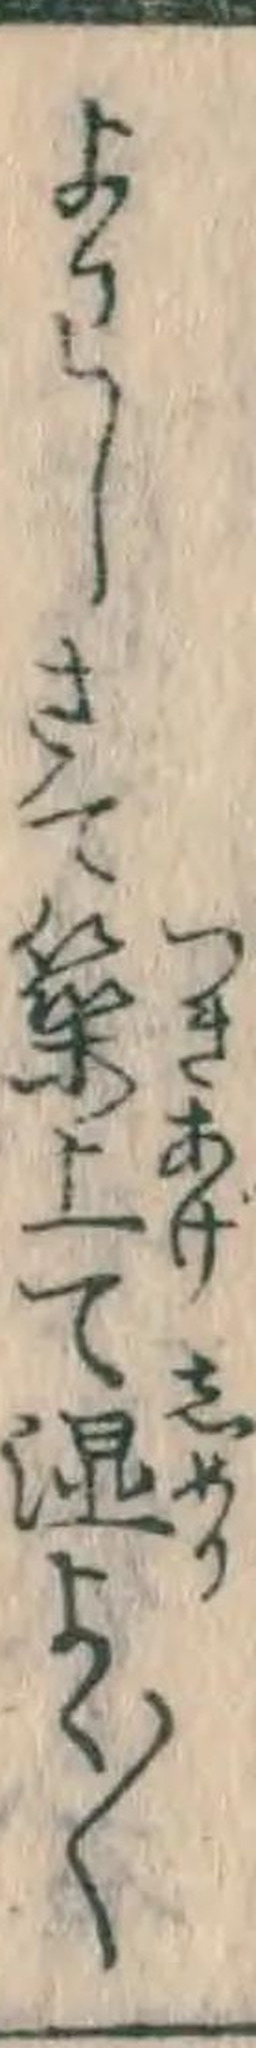よわしさて築上て湿よく〳〵
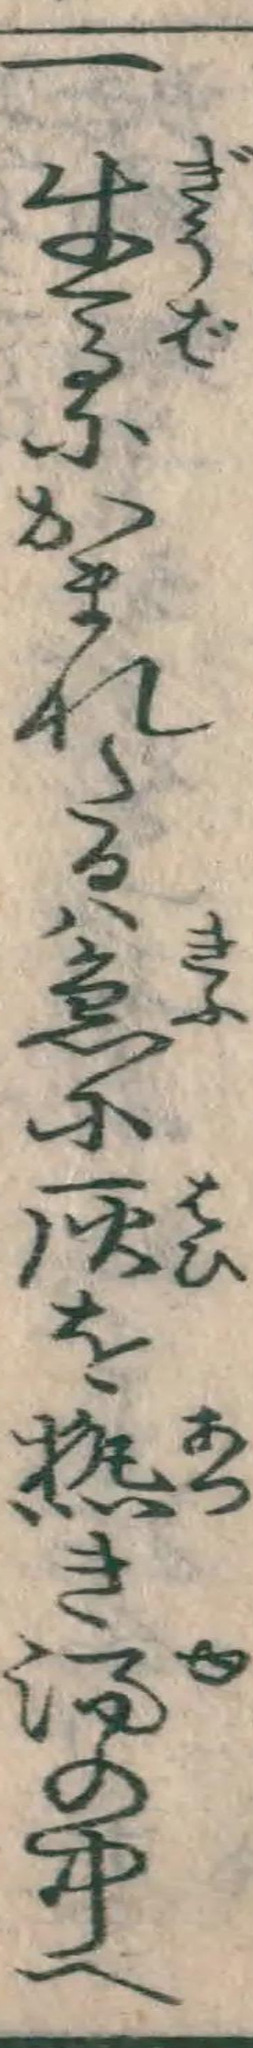一牛馬にかまれたるは急に灰を熱き湯の中へ
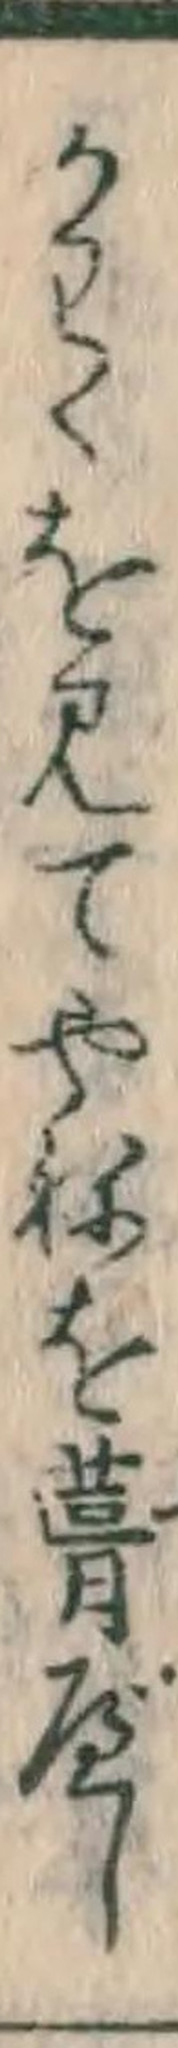かわくを見てやねを葺べし
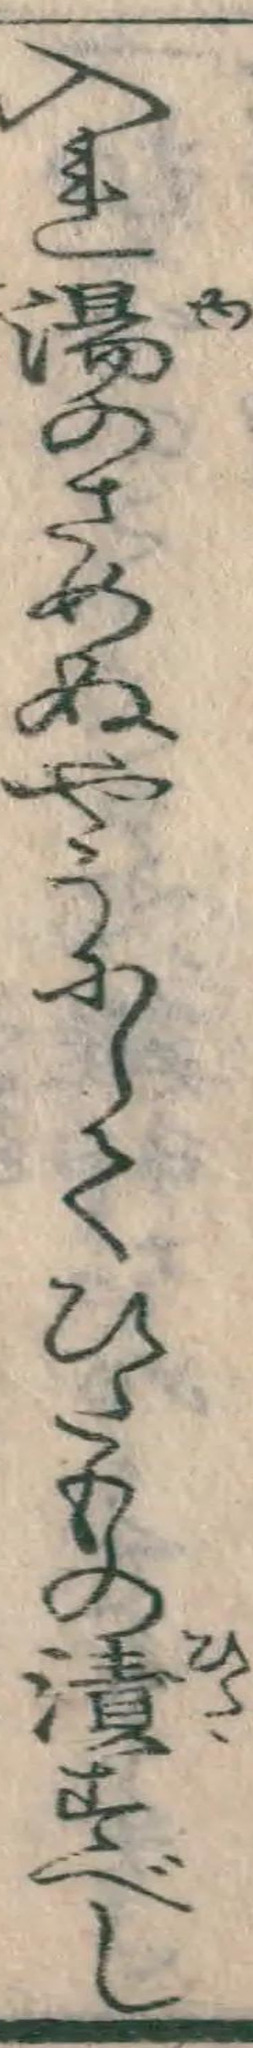いれ湯のさめぬやうにしてひたもの漬すべし
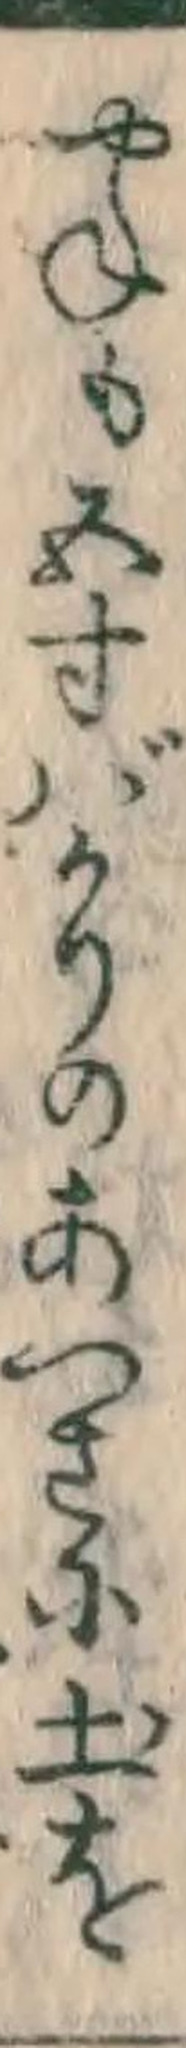やねも五寸ばかりのあつきに土を
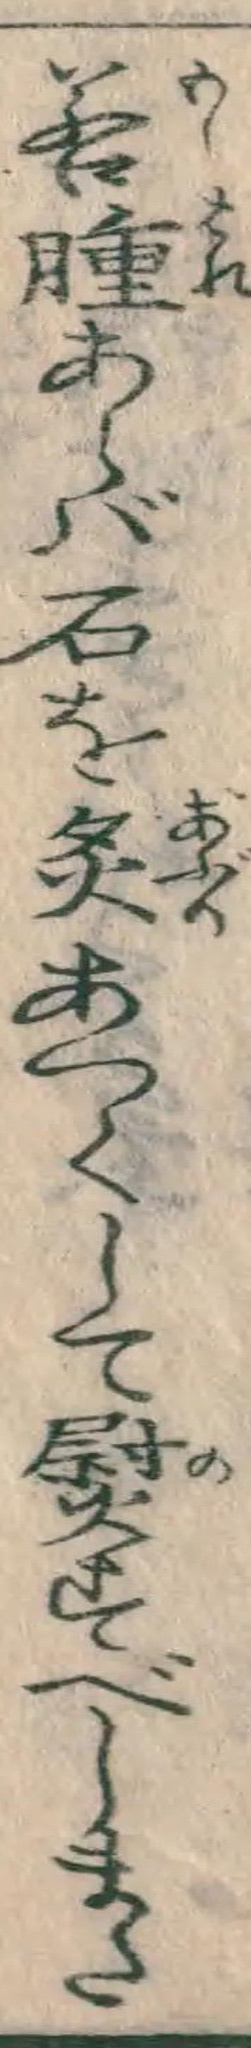若腫あらば石を炙あつくして熨すべしまた
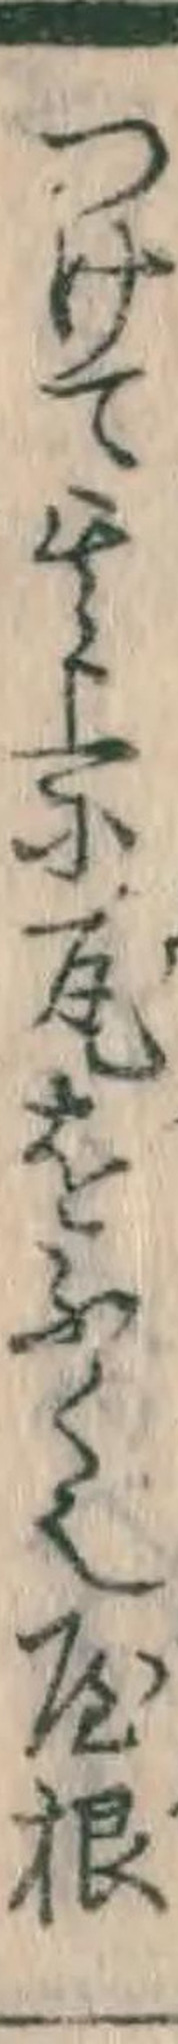つけて其上に瓦をふく也屋根
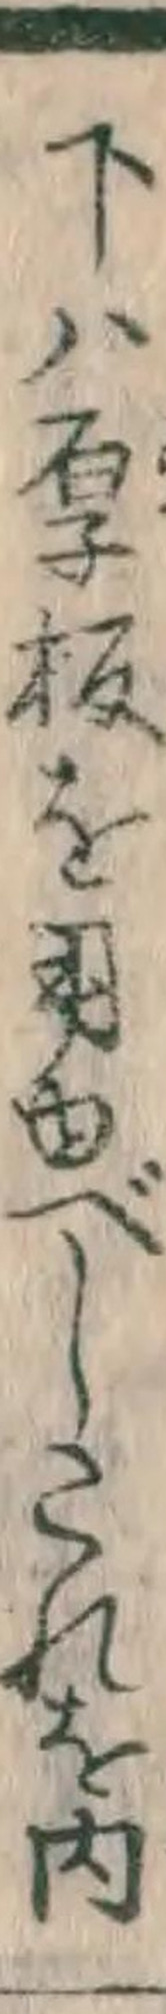下は厚板を用ゆべしこれを内
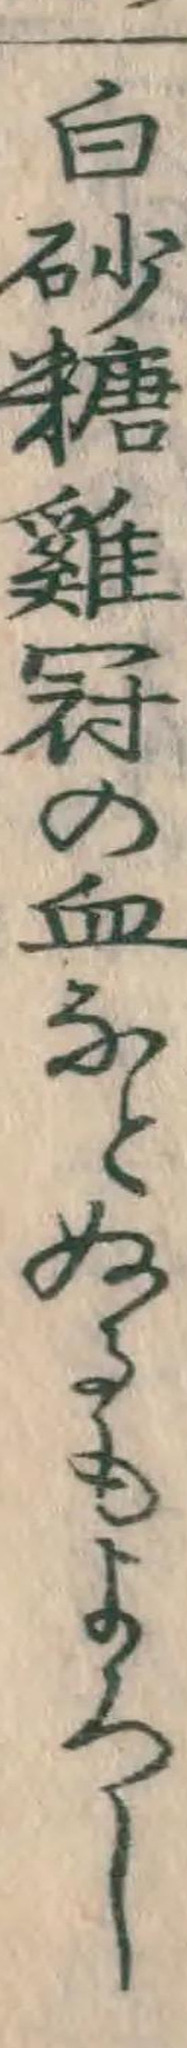白砂糖鶏冠の血なとぬるもよろし
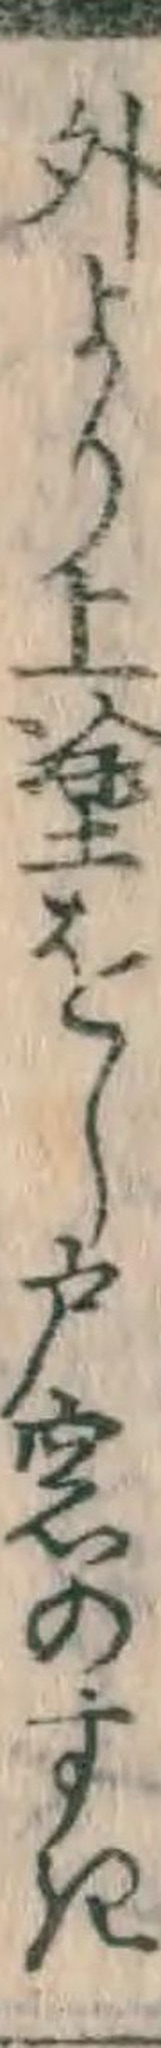外より上塗をし戸窓のすき
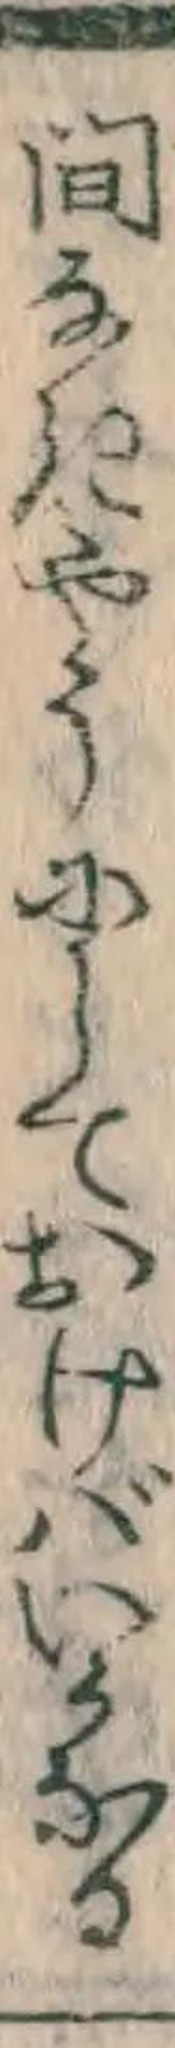間なきやうにしておけばいかなる
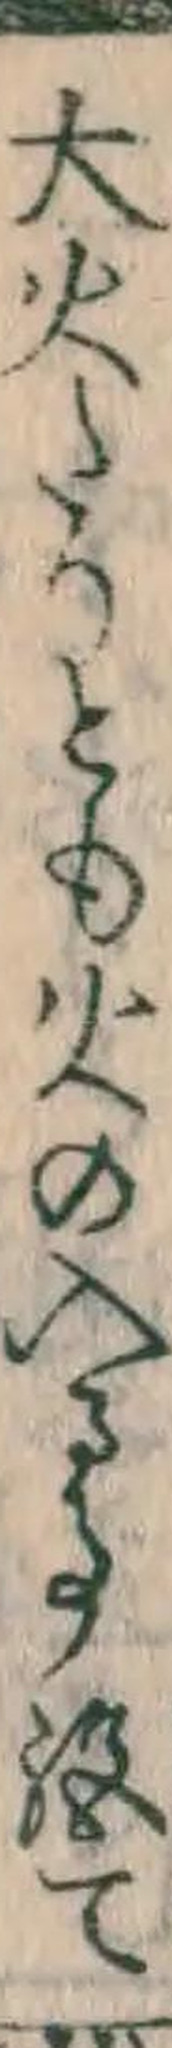大火たりとも火の入る事絶て
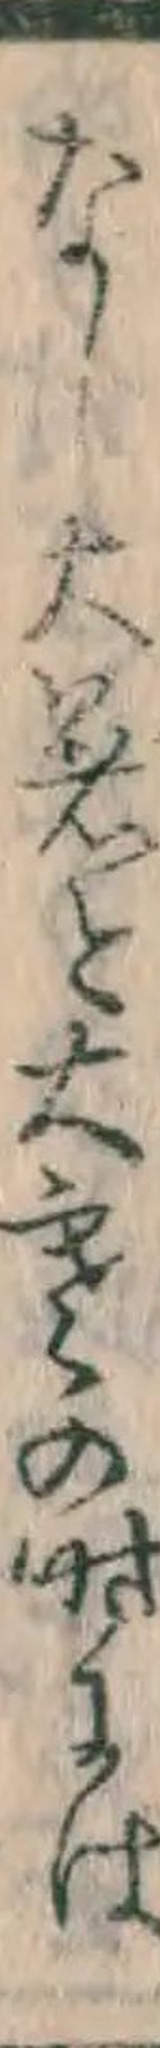なし大暑と大寒の時には
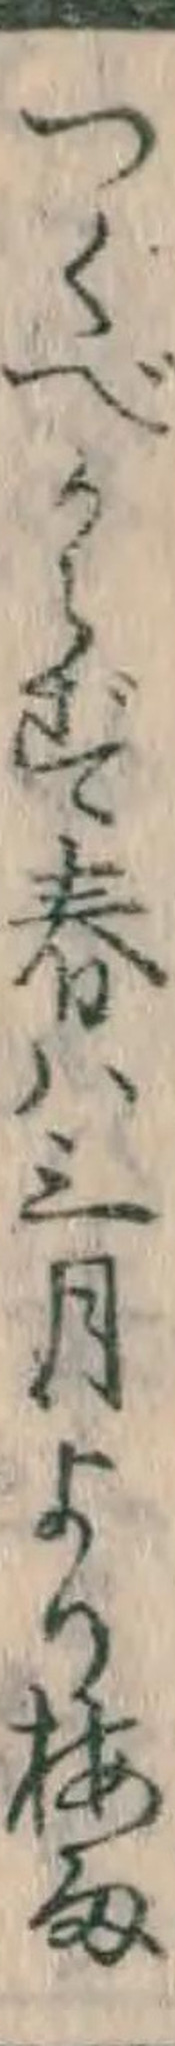つくべからず春は三月より梅雨
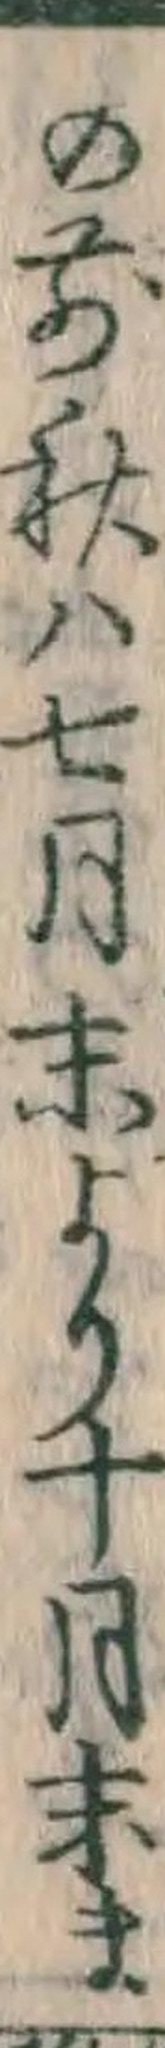の前秋は七月末より十月末ま
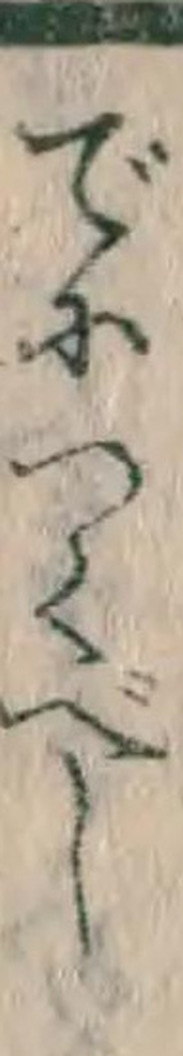でにつくべし
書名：広益秘事大全 3巻. [3]
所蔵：国立国会図書館 National Diet Library, JAPAN
